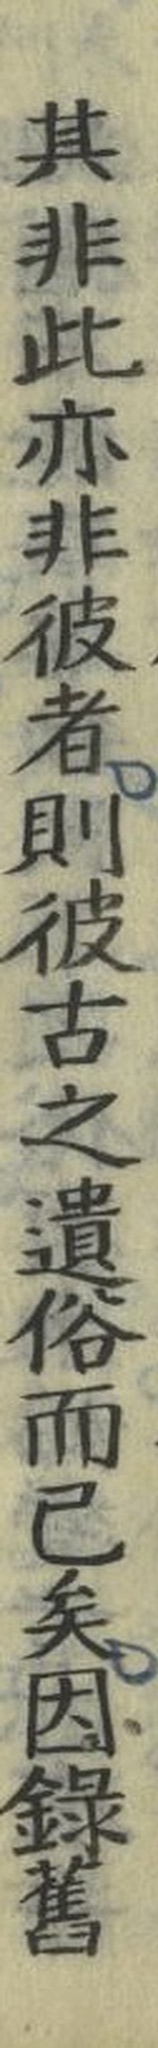其非此亦非彼者。則彼古之遺俗而已矣。因錄舊
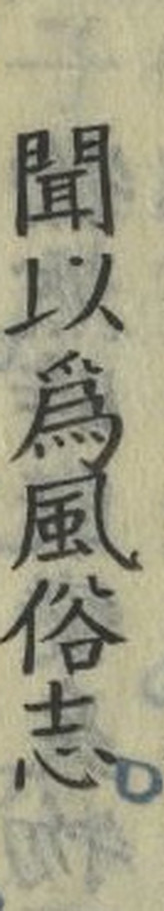聞以爲風俗志。
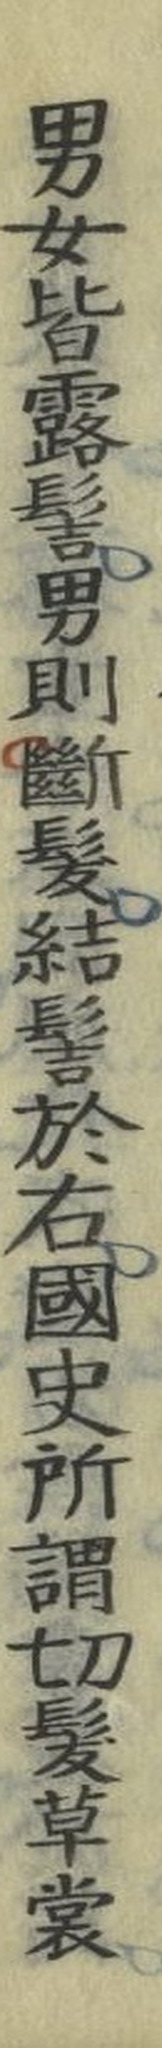男女皆露髻。男則斷髪。結髻於右。國史所謂切髪草裳。
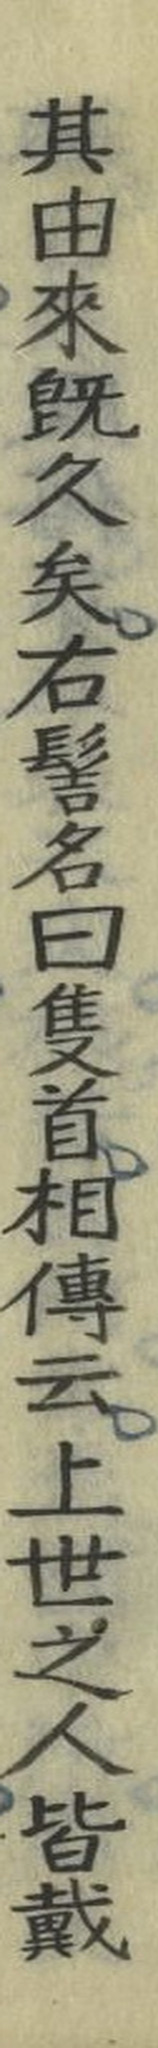其由來既久矣。右髻名曰隻首。相傳云。上世之人皆戴
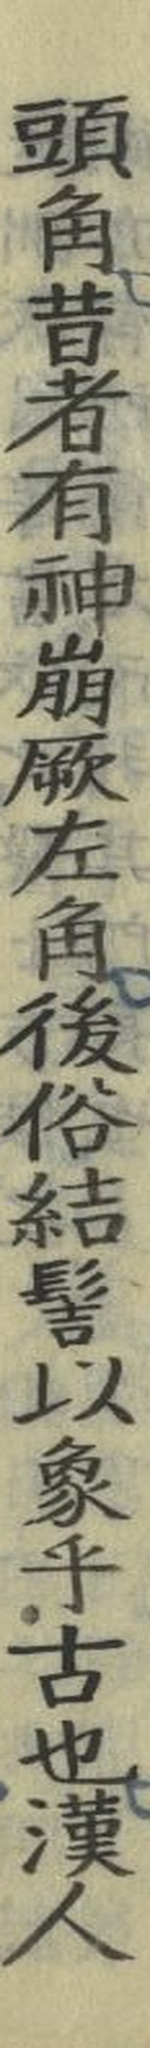頭角。昔者有神崩厥左角。後俗結髻以象乎古也。漢人
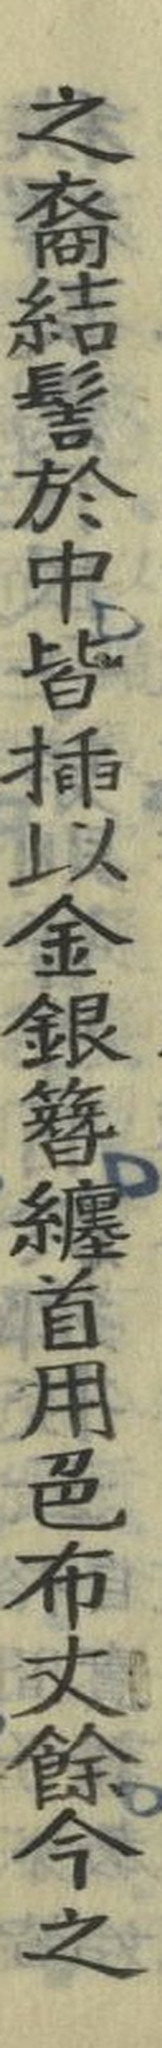之裔結髻於中。皆揷以金銀簪。纏首用色布丈餘。今之
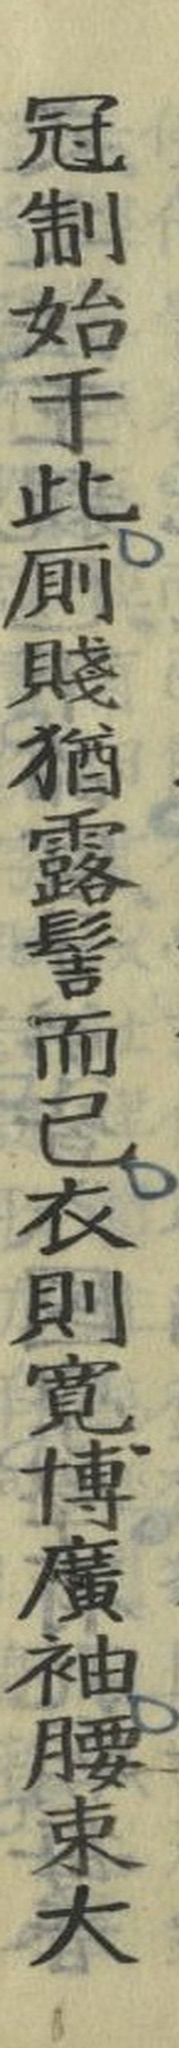冠制始于此。厠賤猶露髻而已。衣則寛博廣袖。腰束大
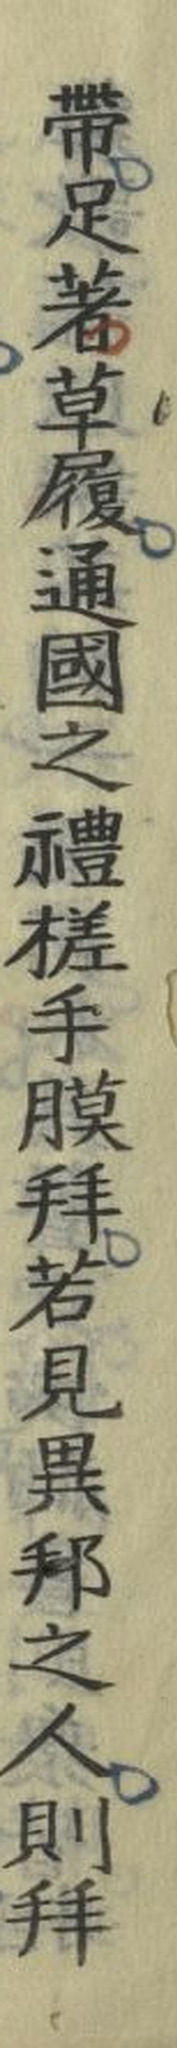帶。足著草履。通國之禮槎手膜拜。若見異邦之人。則拜
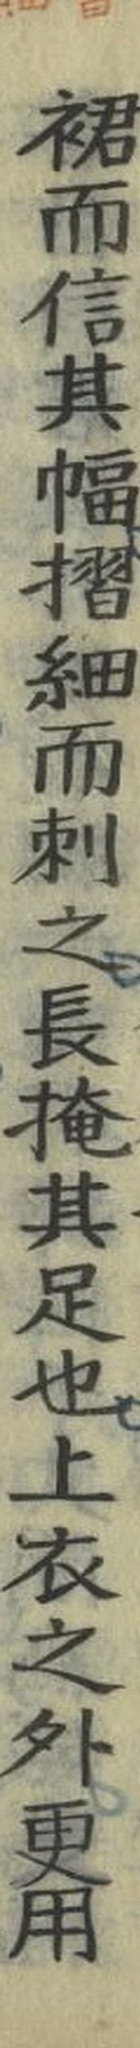裙而信其幅。摺細而刺之。長掩其足也。上衣之外。更用
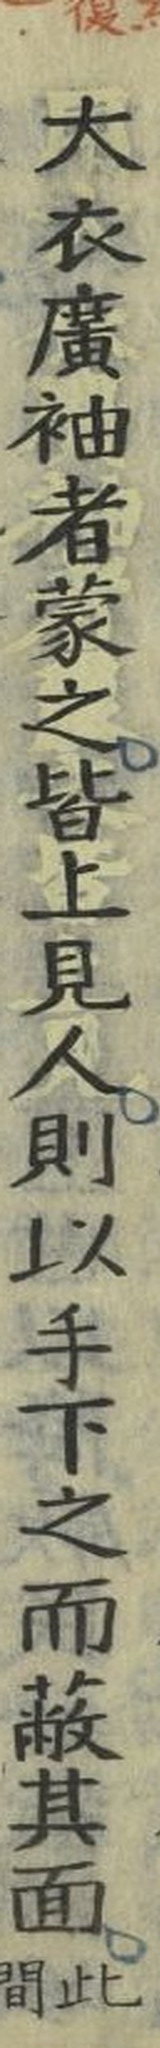大衣廣袖者蒙之。皆上見人。則以手下之而蔽其面。此間
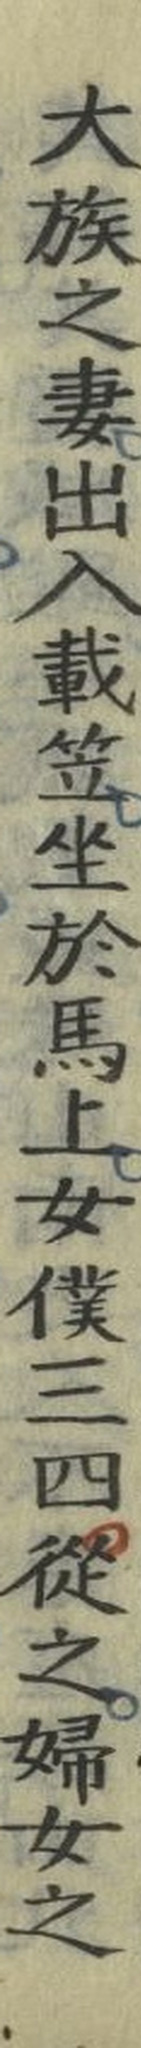大族之妻。出入載笠。坐於馬上。女僕三四從之。婦女之
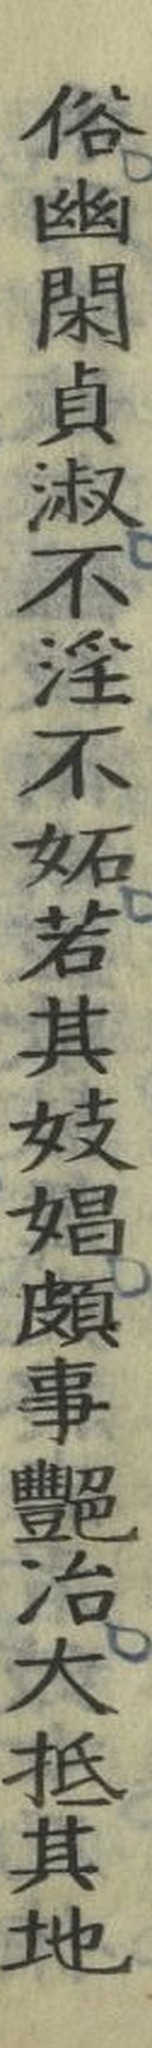俗。幽閑貞淑。不淫不妬。若其妓娼。頗事艷冶。大抵其地
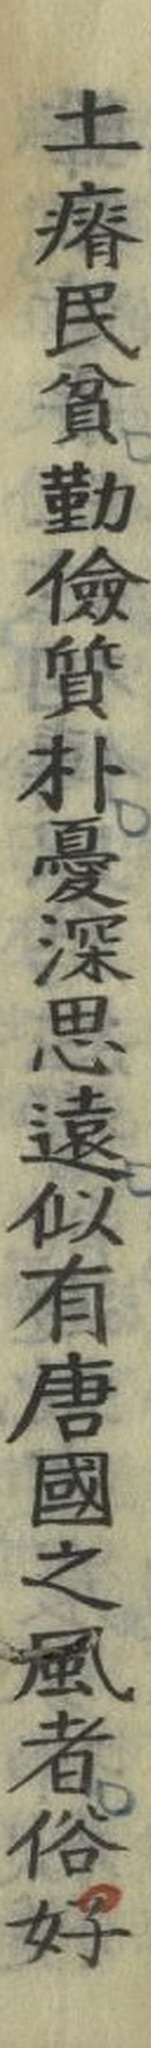土瘠民貧。勤儉質朴。憂深思遠。以有唐國之風者。俗好

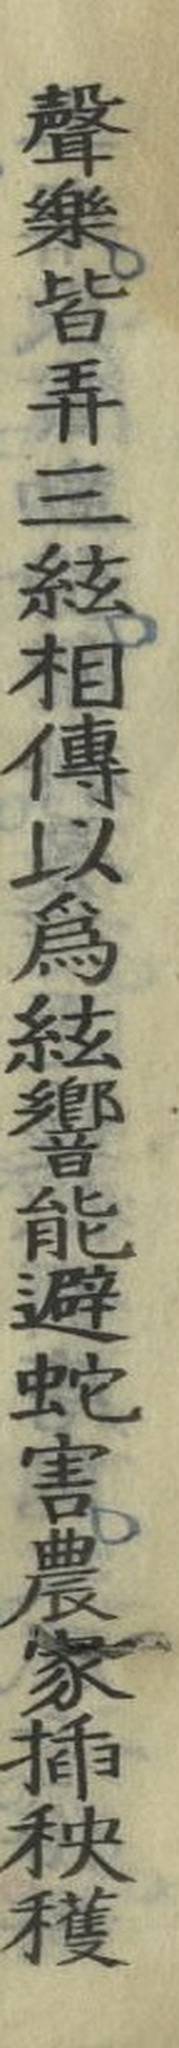聲樂。皆弄三絃。相傳以爲絃響能避蛇害。農家揷秧穫
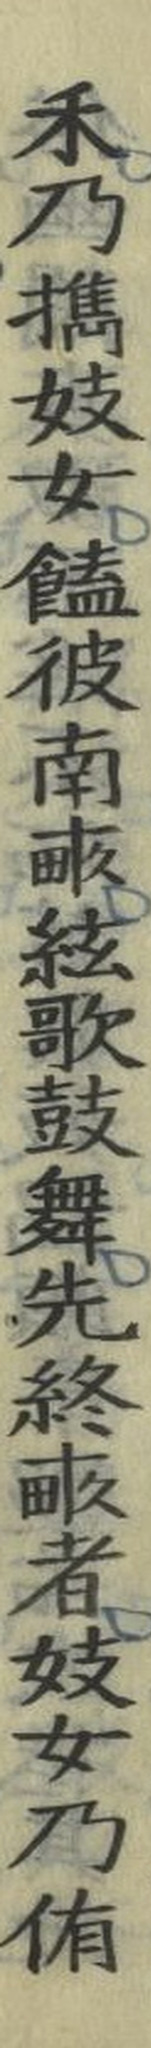禾。乃擕妓女。饁彼南畞。絃歌鼓舞。先終畞者。妓女乃侑
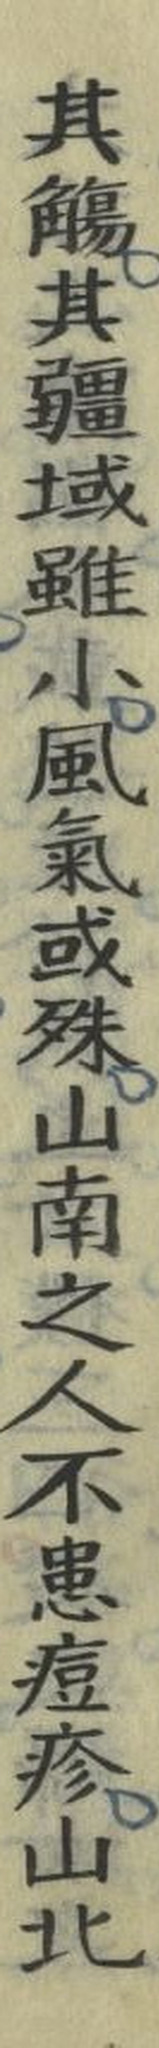其觴。其疆域雖小。風氣或殊。山南之人不患痘疹。山北
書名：南島志
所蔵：University of the Ryukyus Library
